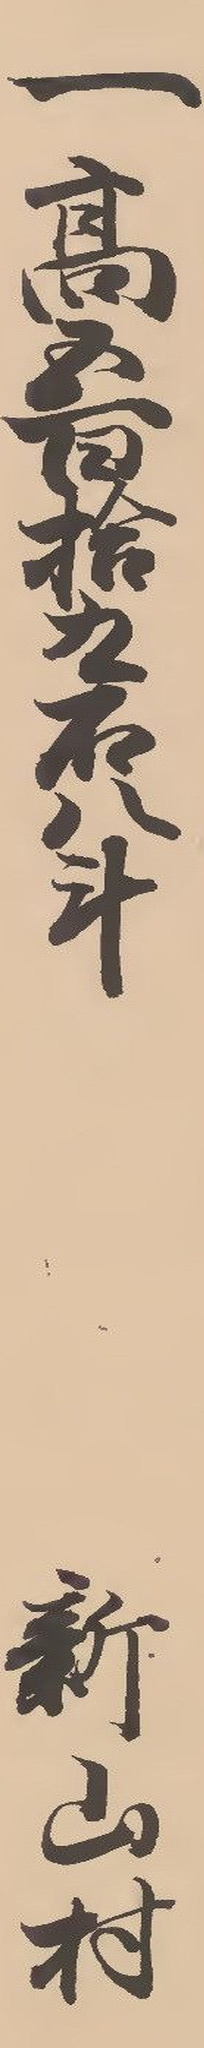一高五百拾九石八斗新山村
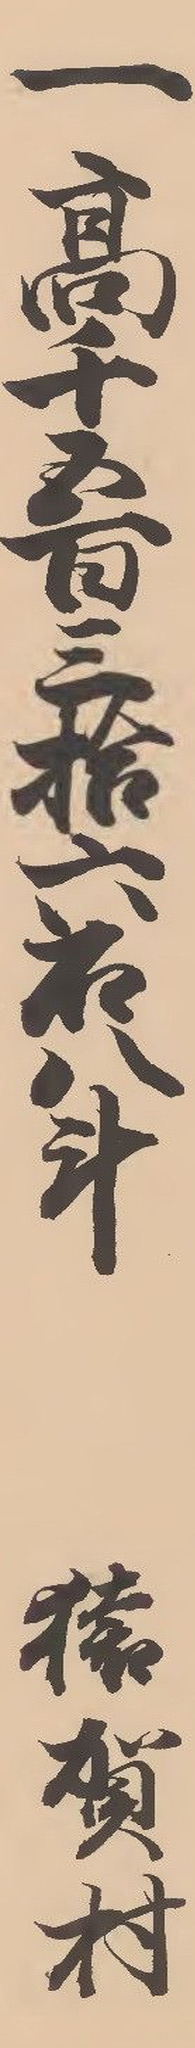一高千五百三拾六石八斗猿賀村
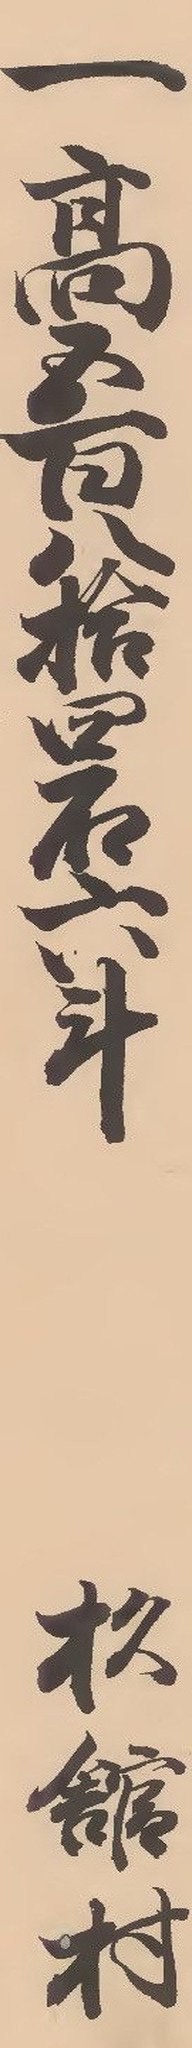一高五百八拾四石六斗杉館村

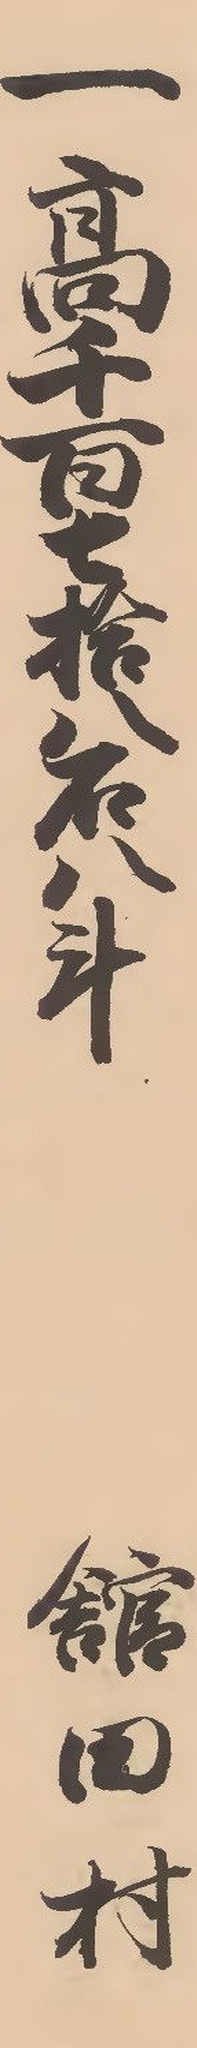一高千百七拾八名八斗館田村
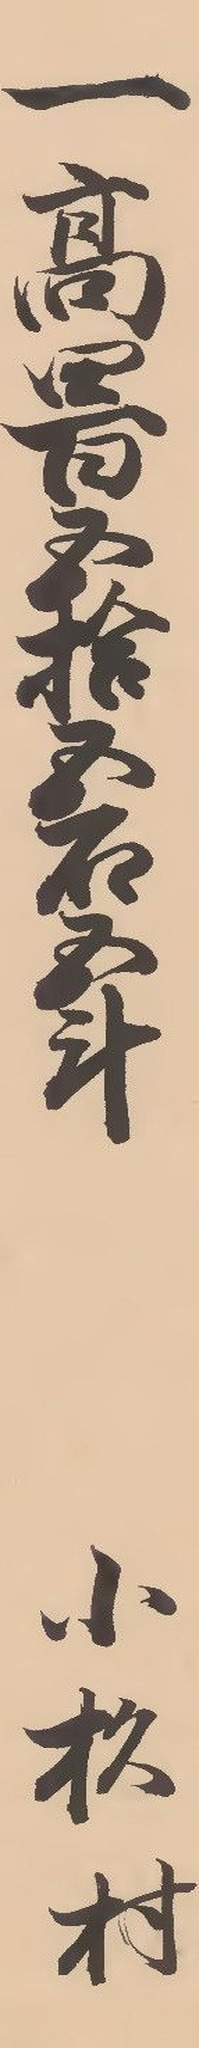一高四百五拾五石五斗小杉村
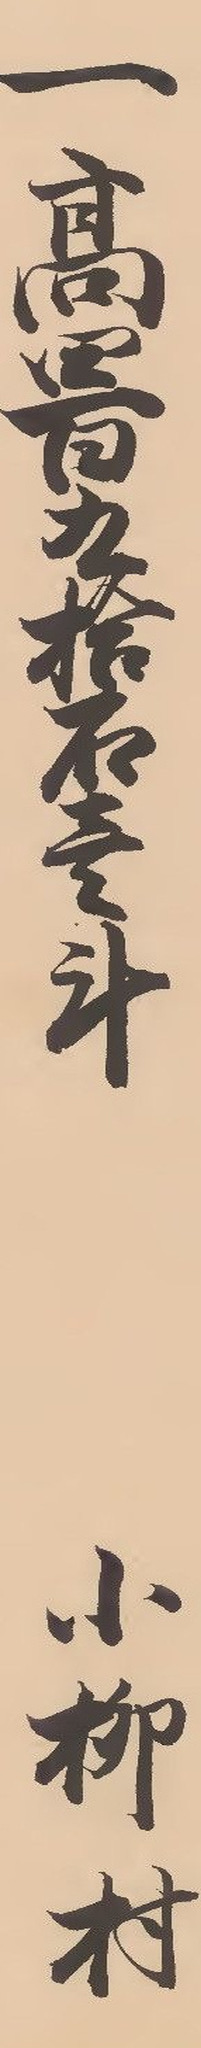一高四百九拾石壱斗小柳村
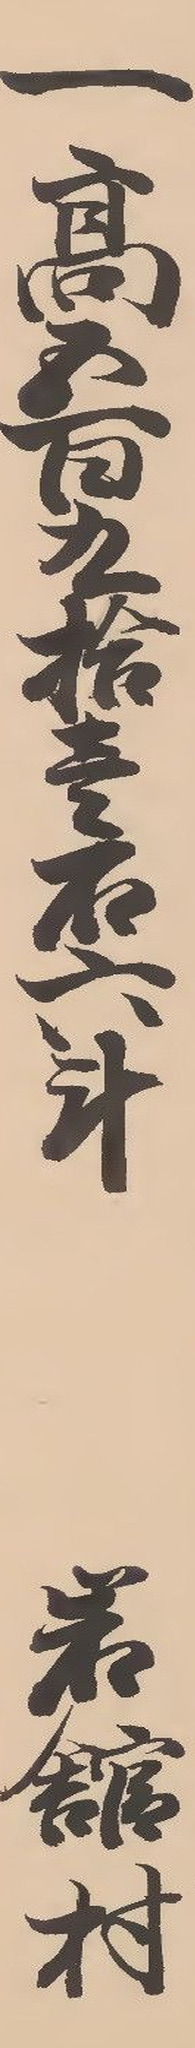一高五百九拾壱石六斗岩舘村
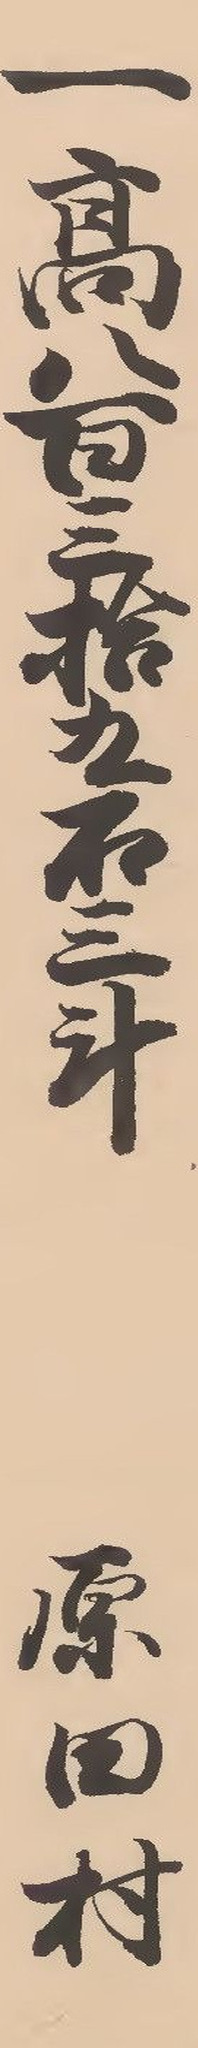一高八百三拾九石三斗原田村
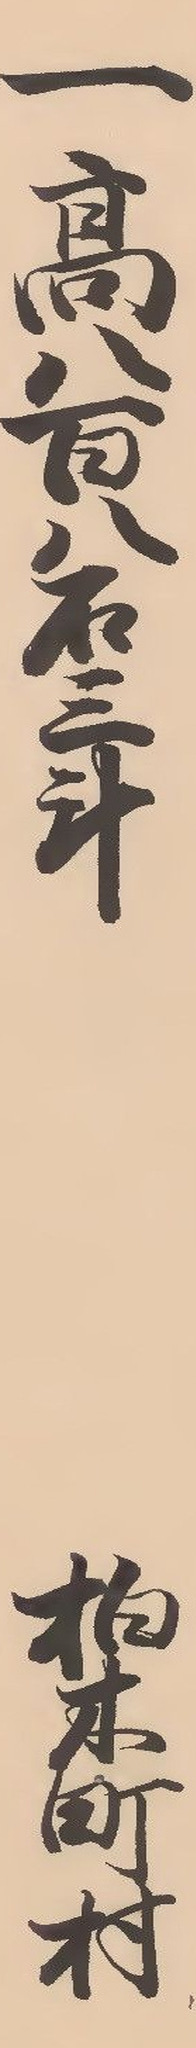一高八百八石三斗柏木町村

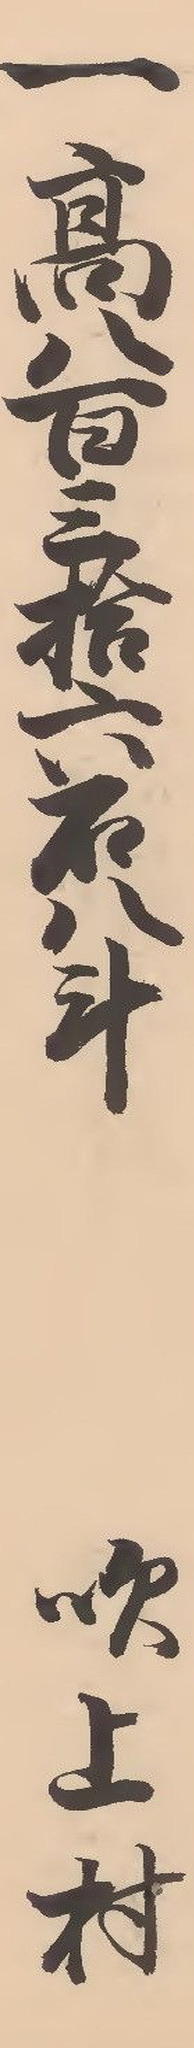一高八百三拾六石八斗吹上村
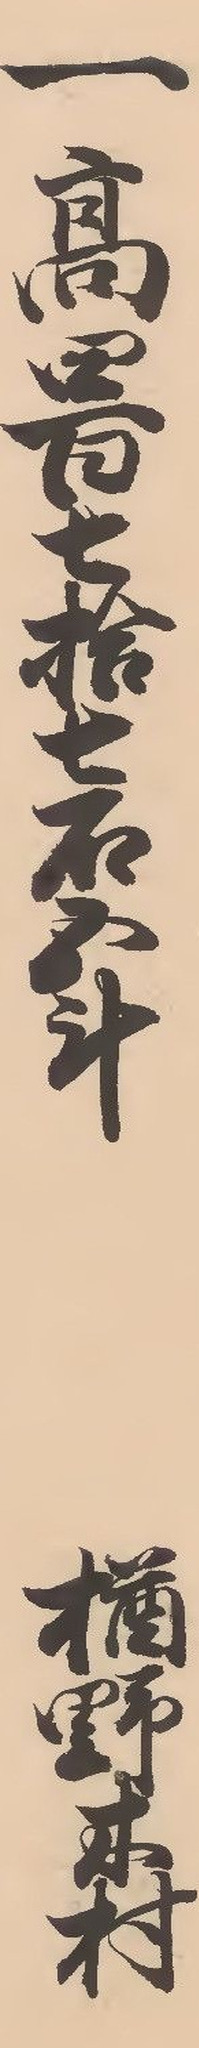一高四百七拾七石五斗楢野木村
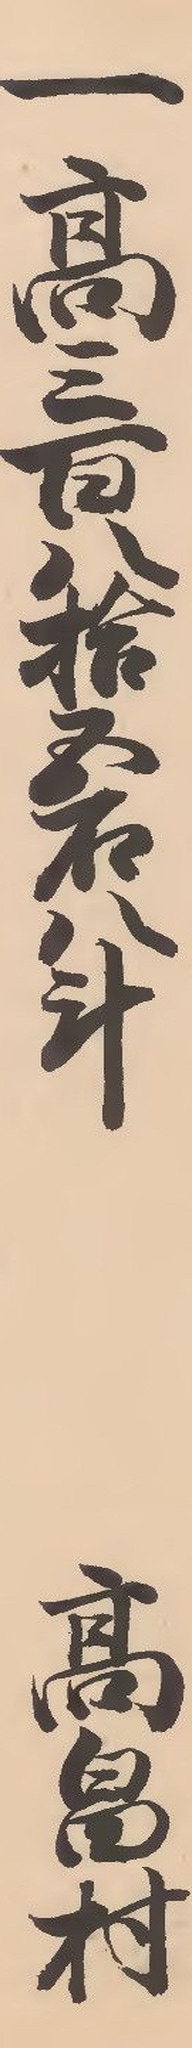一高三百八拾五石八斗高畠村
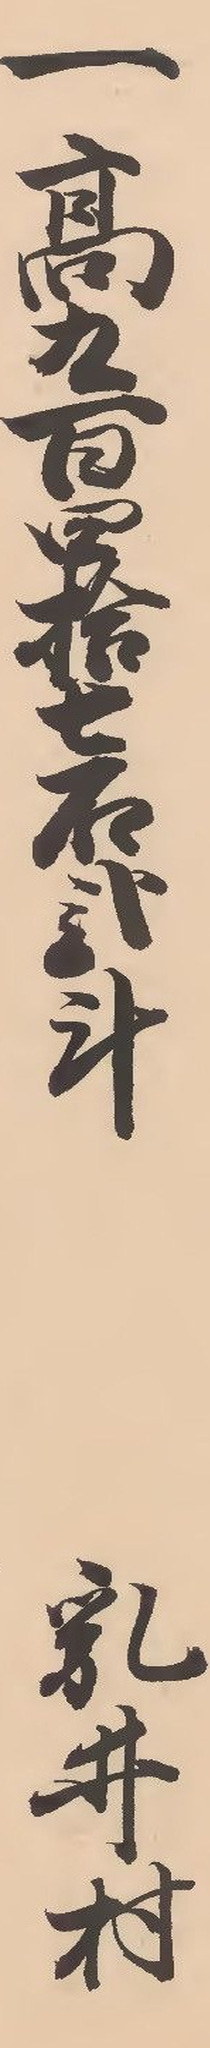一高九百四拾七石弐斗乳井村
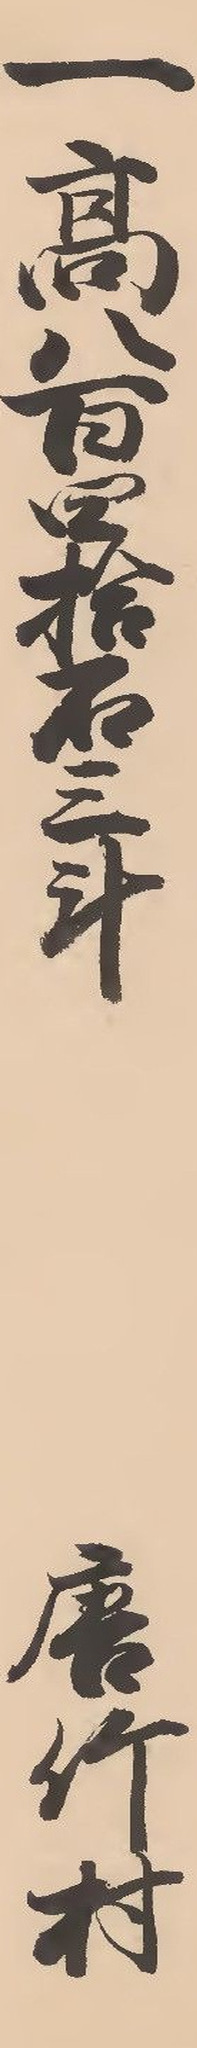一高八百四拾石三斗唐竹村
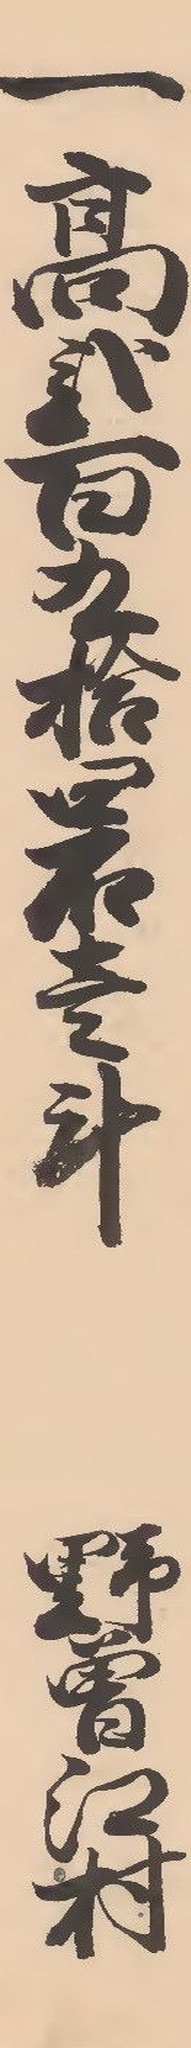一高弐百九拾四石壱斗野曽江村

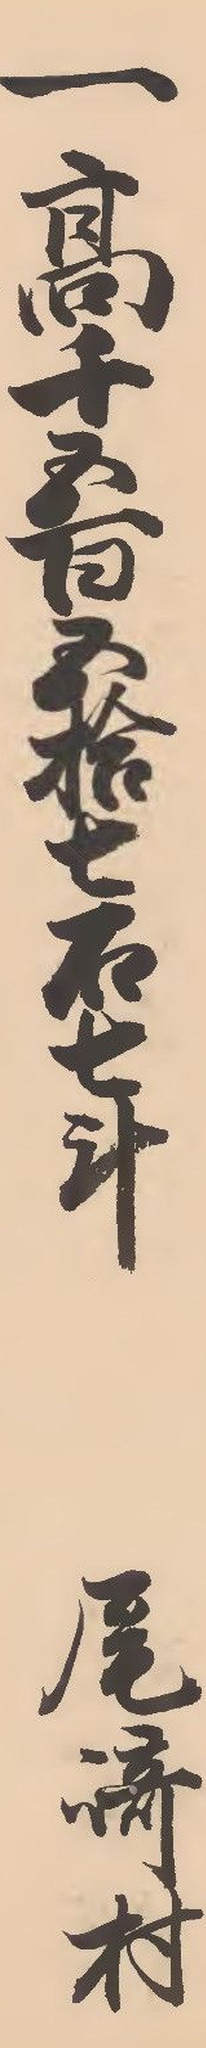一高千五百五拾七石七斗尾崎村
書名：陸奥国郷帳　７
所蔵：国立公文書館 National Archives of Japan
